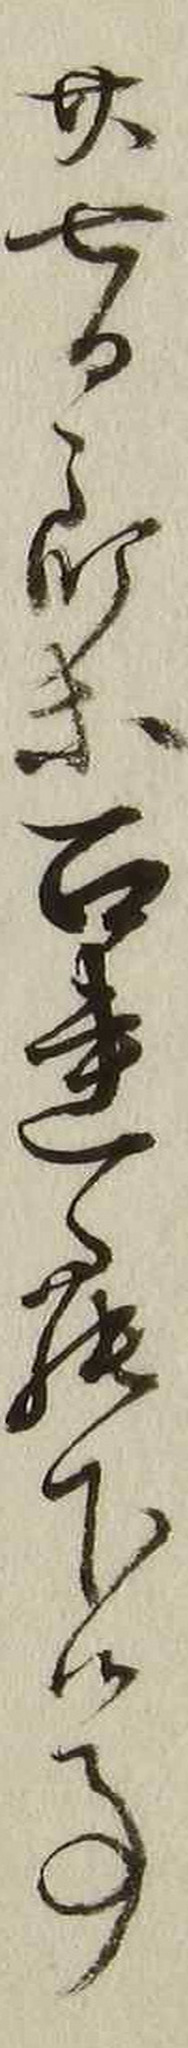廿七日郎等召連罷下候事
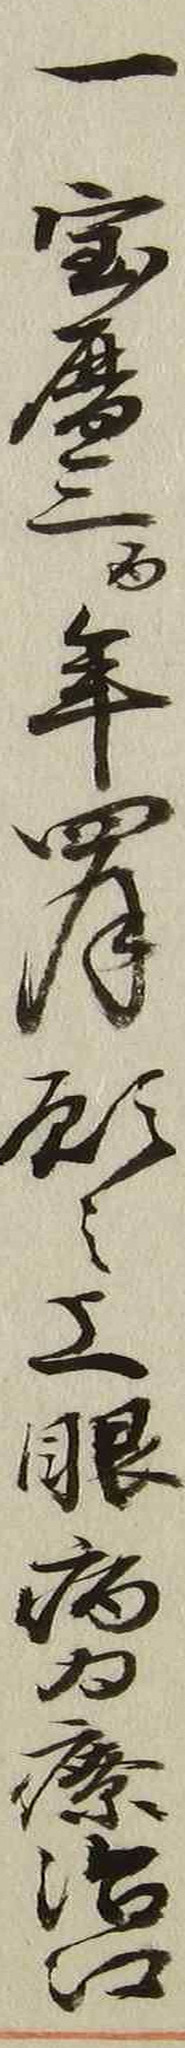一宝暦三酉年四月願之上眼病為療治江
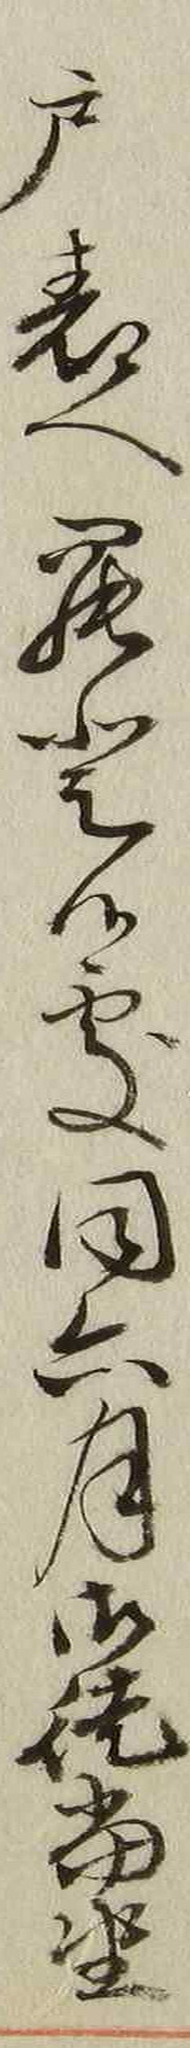戸表へ罷登候処同六月御徒当坐
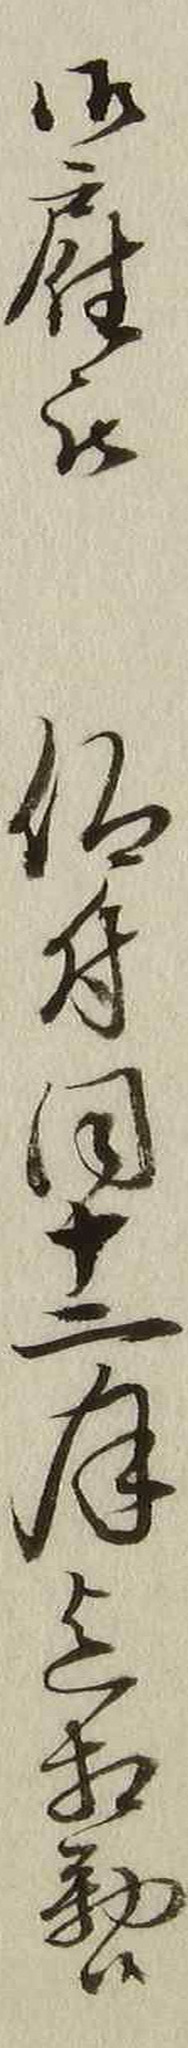御雇被仰付同十二月迄相勤候
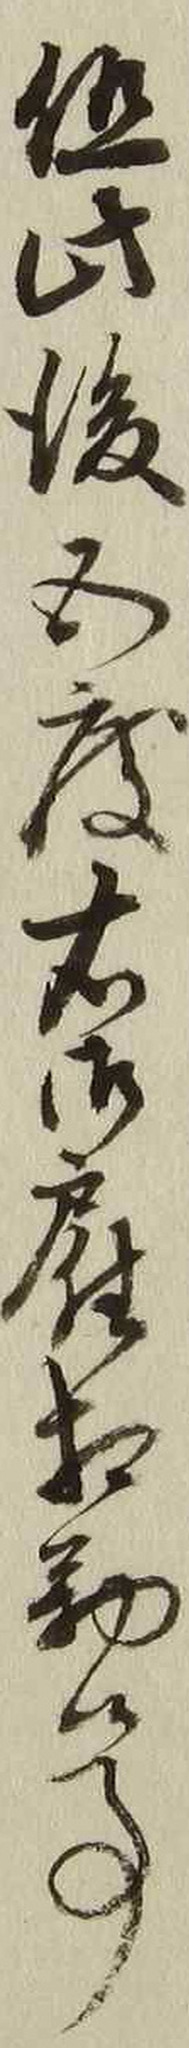但此後五度右御雇相勤候事
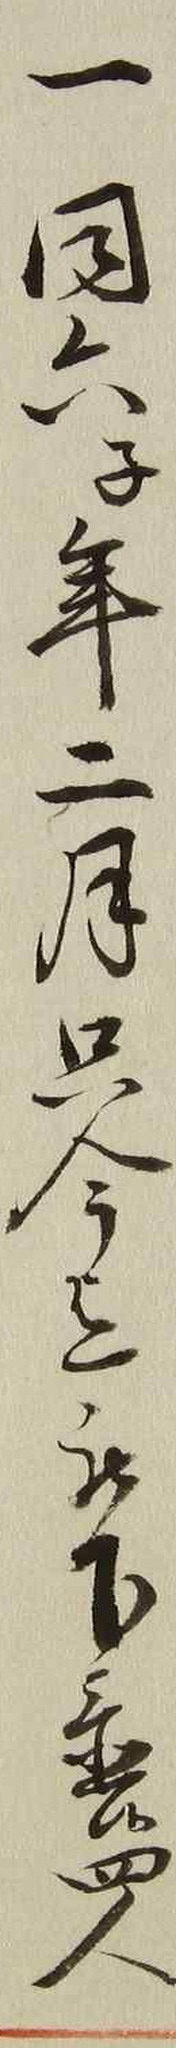一同六子年二月只今迄被下置候四人
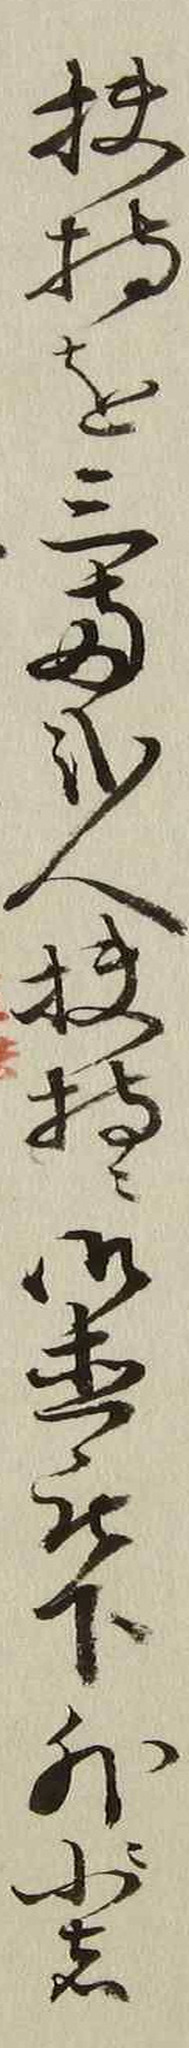扶持を三両弐人扶持ニ御直被下外ニ少者
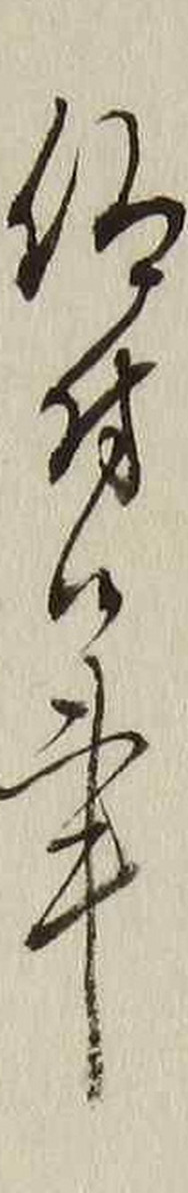仰付候事
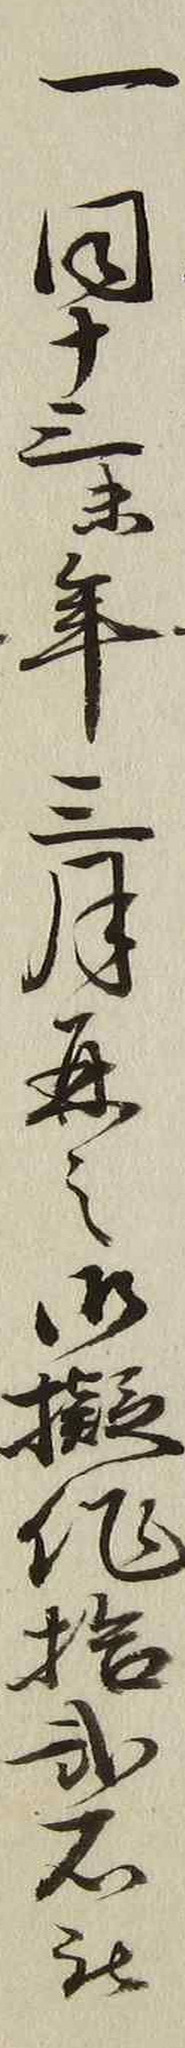一同十三未年三月再之御擬作拾弐石被
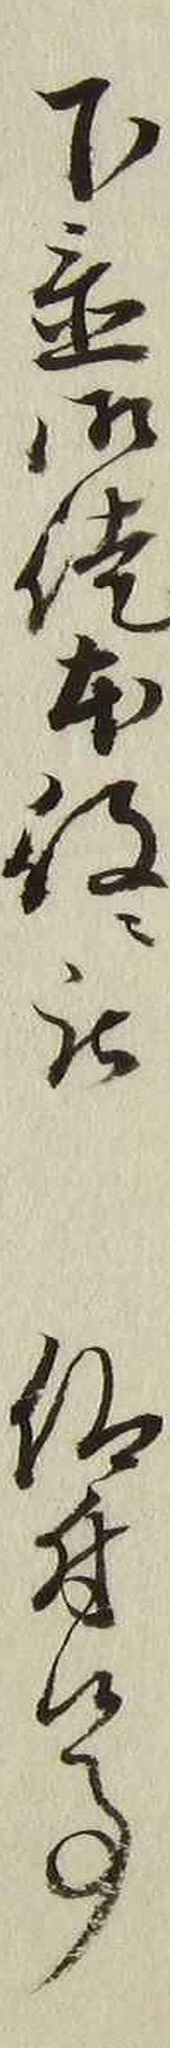下置御徒本役ニ被仰付候事
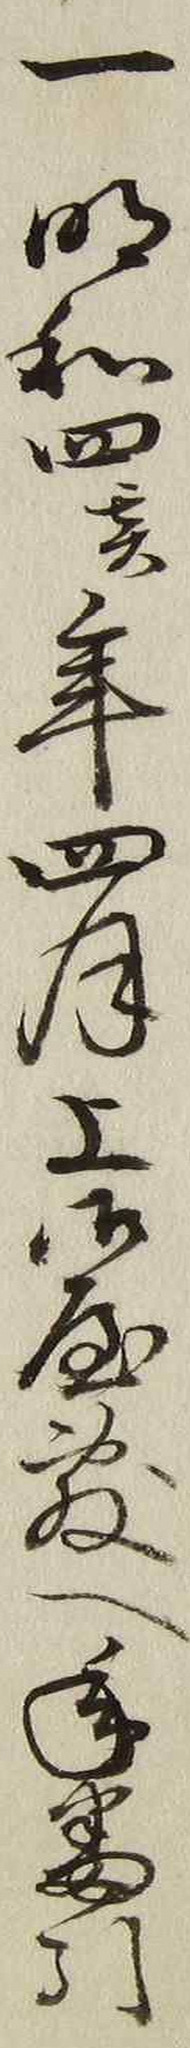一明和四亥年四月上御屋敷へ年番引
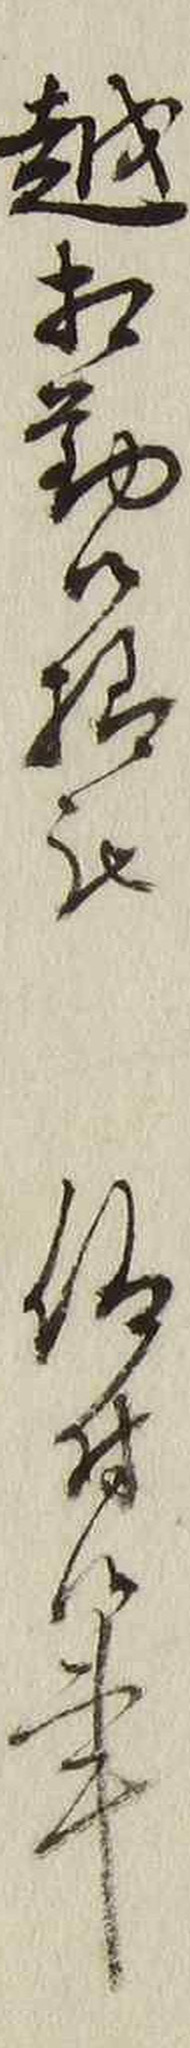越相勤候様被仰付候事
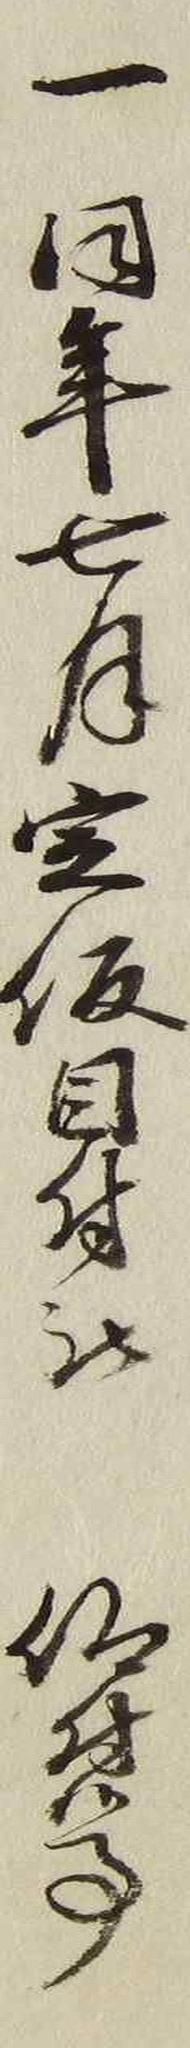一同年七月定仮目付被仰付候事
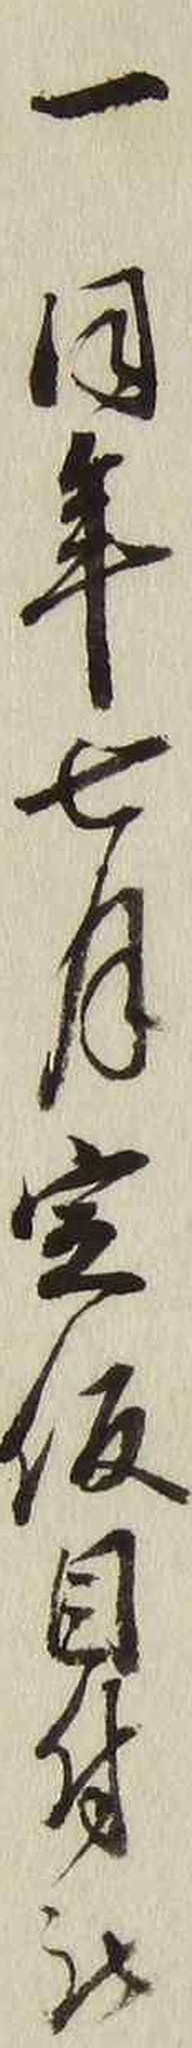一同年七月定仮目付被仰付候事
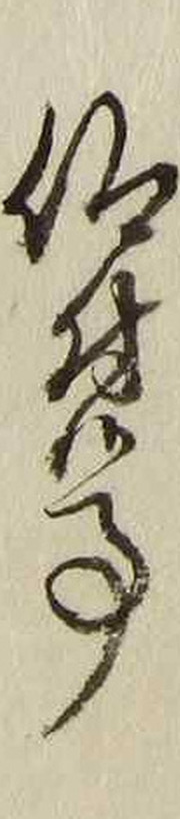仰付候事
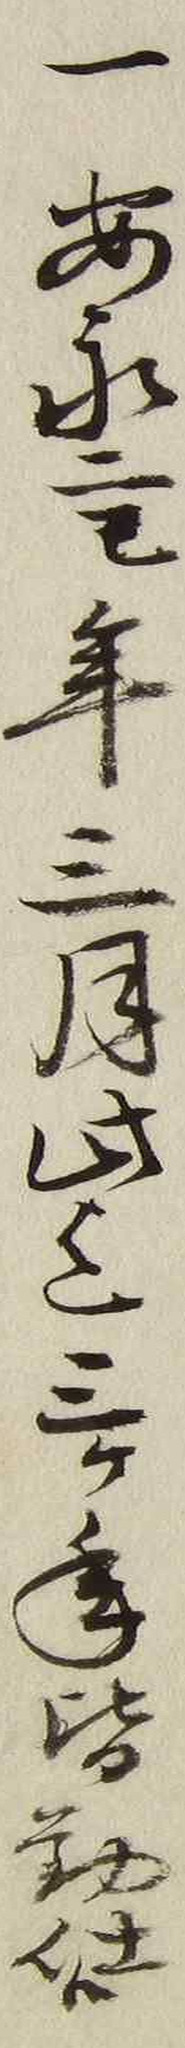一安永二巳年三月此迄三ヶ年皆勤仕候
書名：諸士系譜　巻之39　は之部7
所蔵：会津若松市立会津図書館
